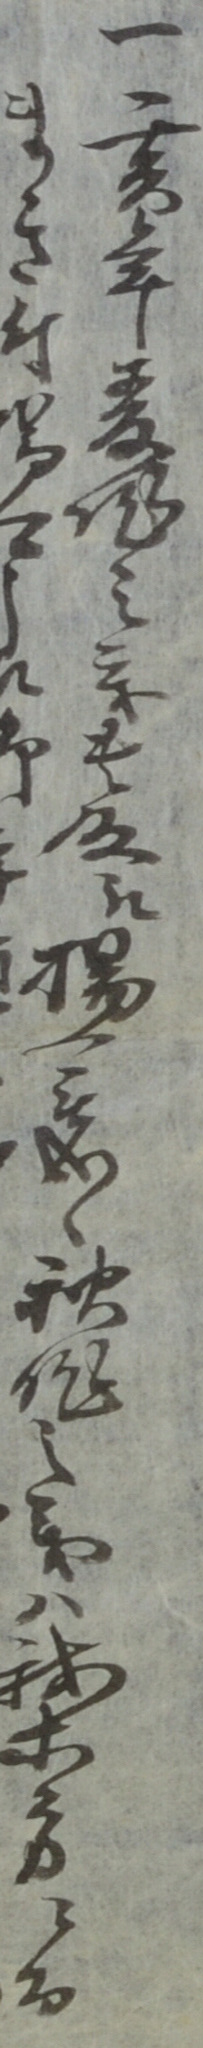一亥年麦作之義貴殿江揚可被成候秋作之義ハ我等方ニ而
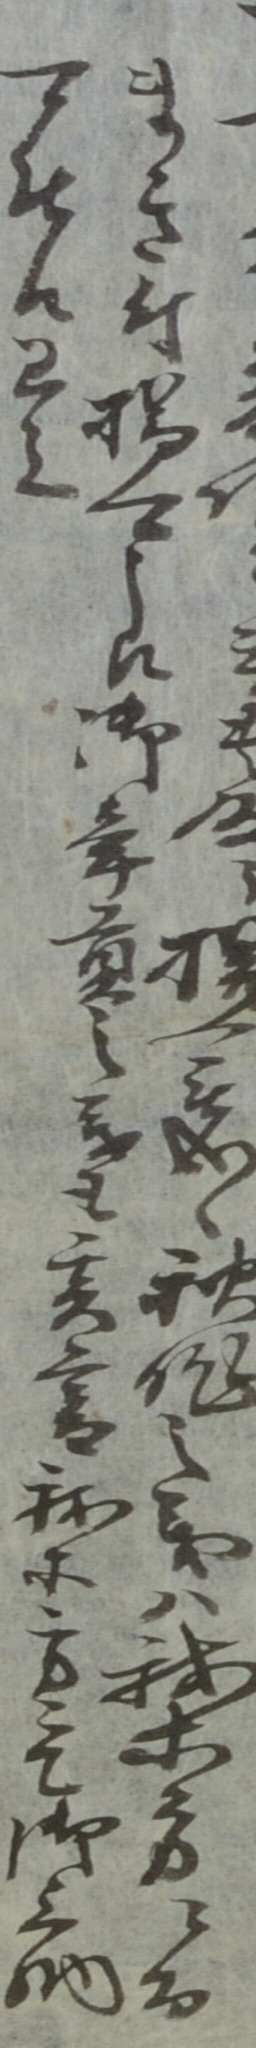まき付揚可申候御年貢之義も亥暮我等方二て御上納
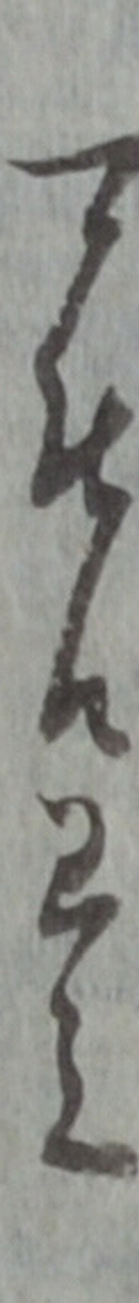可被候已上
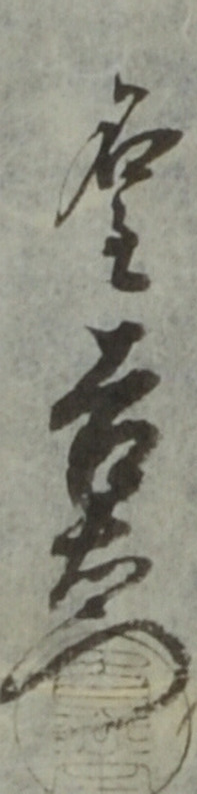名主吉右衛門㊞
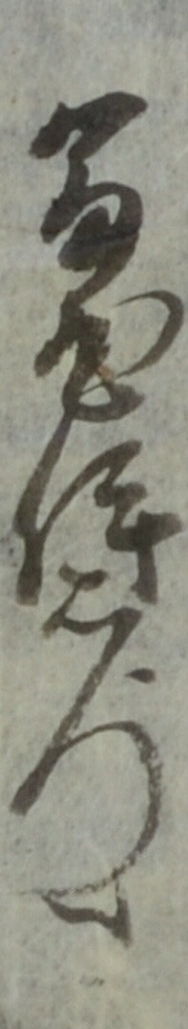富屋伊右衛門

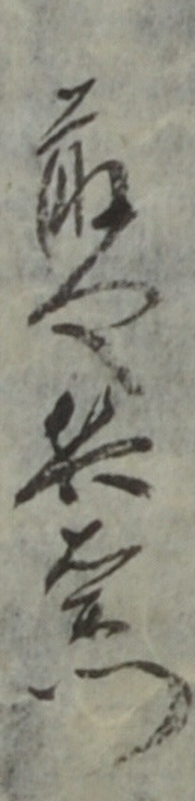前や兵右衛門
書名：年季に売渡申畑之事
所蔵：伊那市立高遠町図書館・合同会社AMANE
